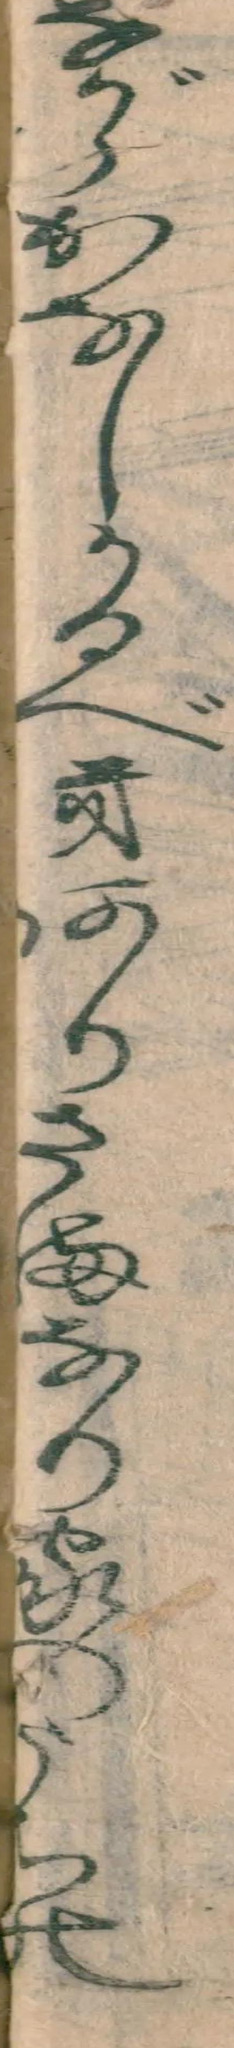ながらかなしかるべきありさまなり家のうちの
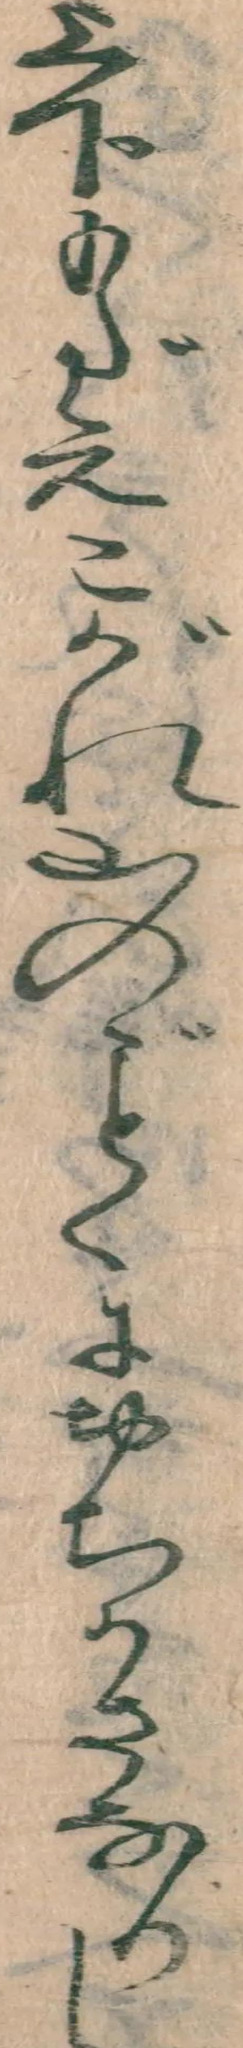上下もだえこがれ山のごとくにおちかさなりし
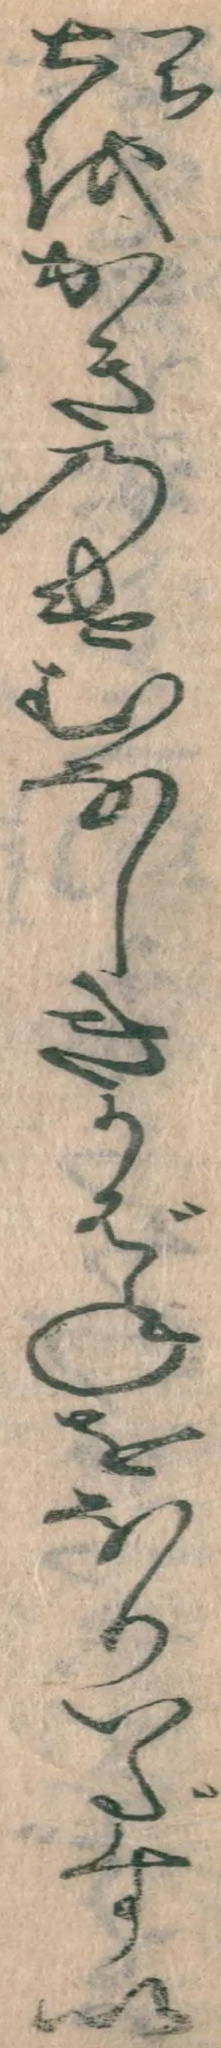土をかきのけむなしきかばねをほりいだすい
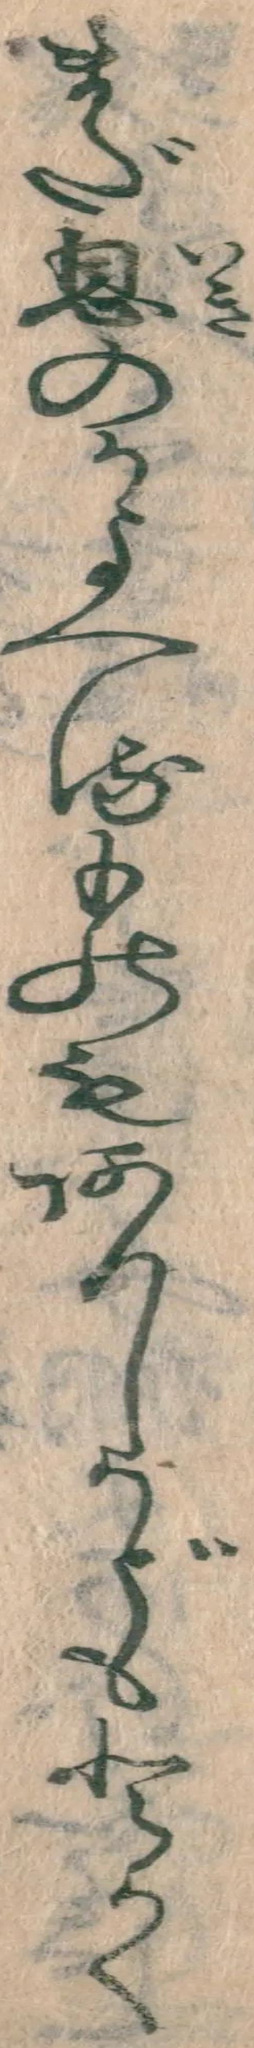まだ息のかよへるものもありしかどもとかく
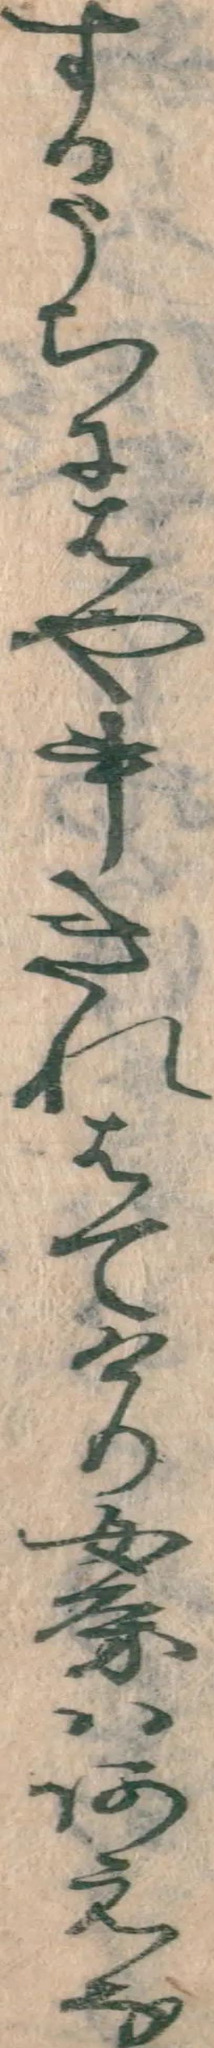するうちにはや事きれはてけり女房はあえな
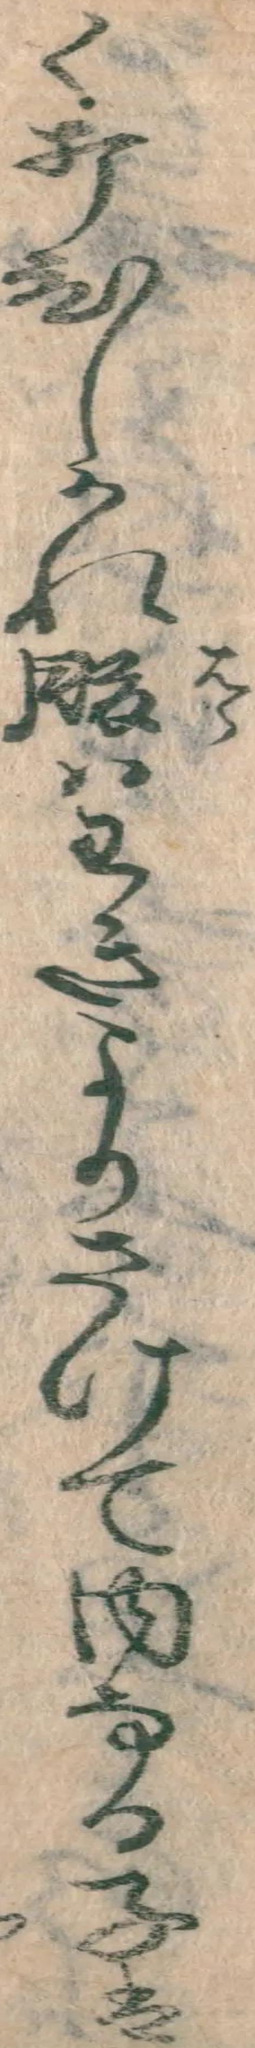く打ひしかれ腹はわきよりさけて内なる子は
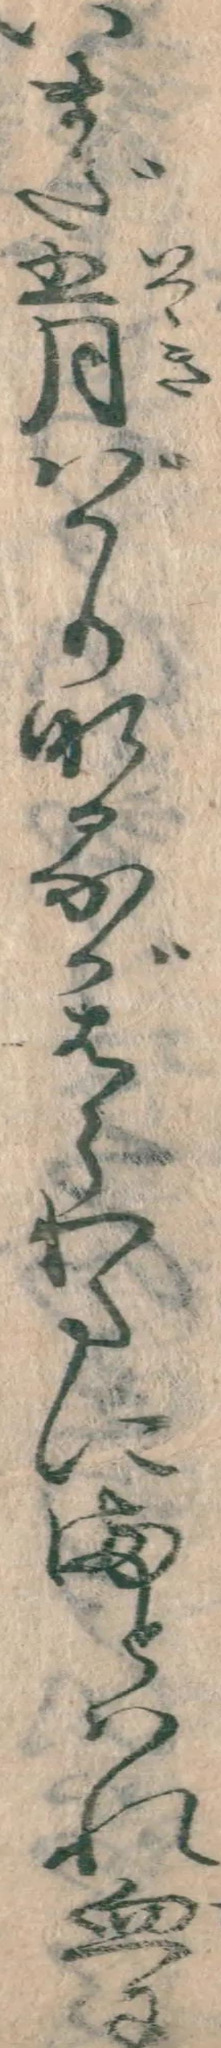いまだ五月ばかりなるがはらわたにまとはれ血に
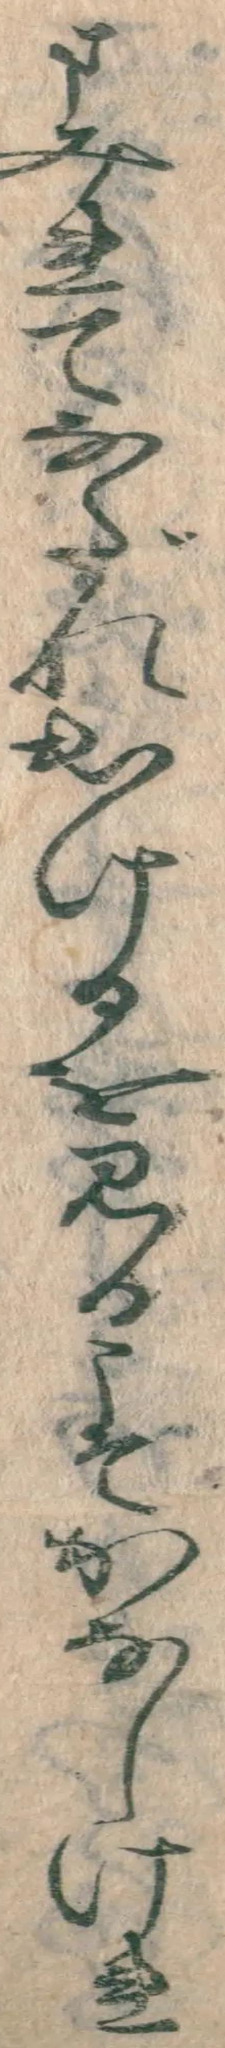まみれてなだれ出けるを見るこそかなしけれ
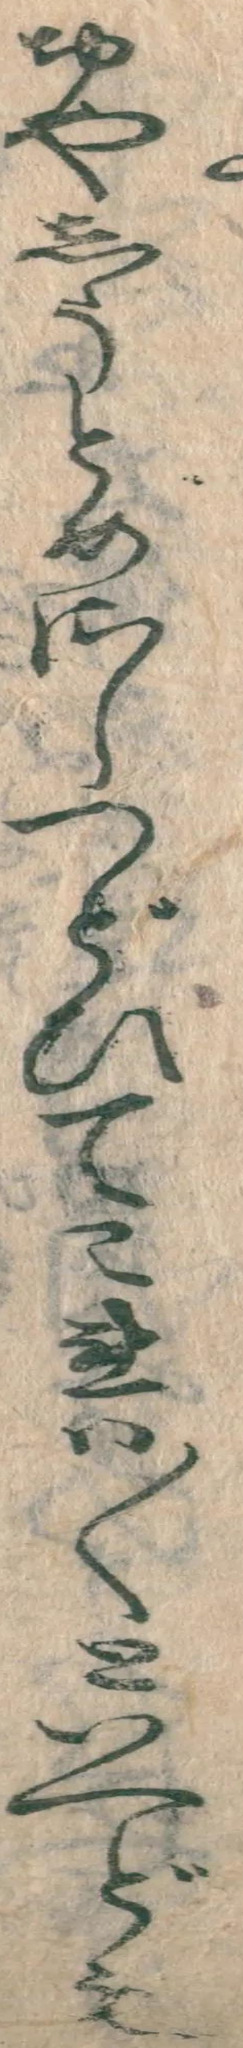おやしうとめさしつどひてこれは〳〵といへども
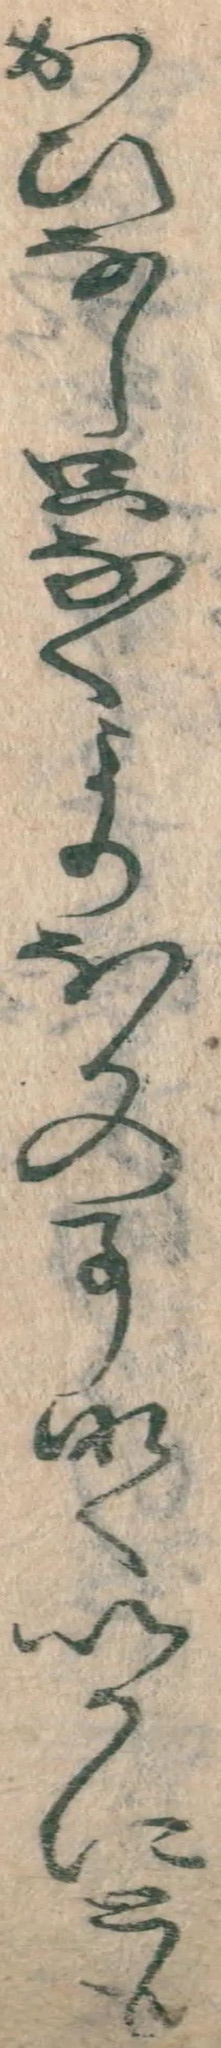かひなし只なくよりほかの事なくいかにとも
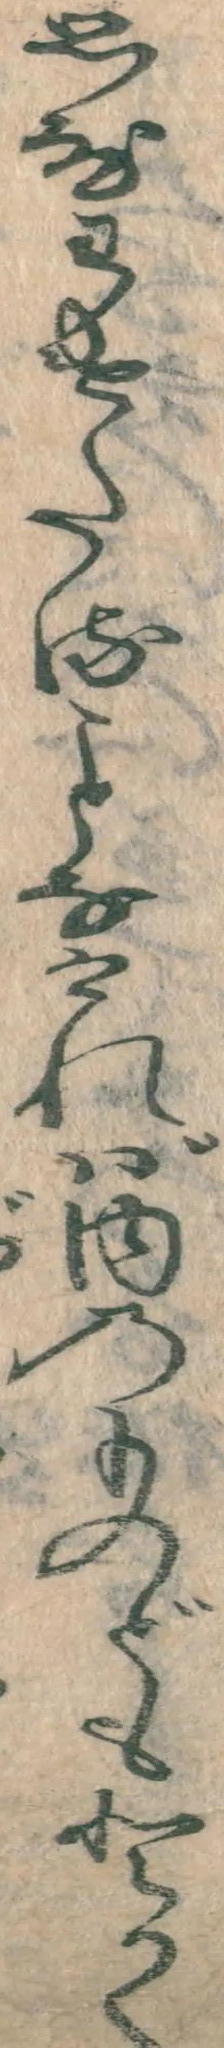思ひわけたることなければ内のものどもとかく
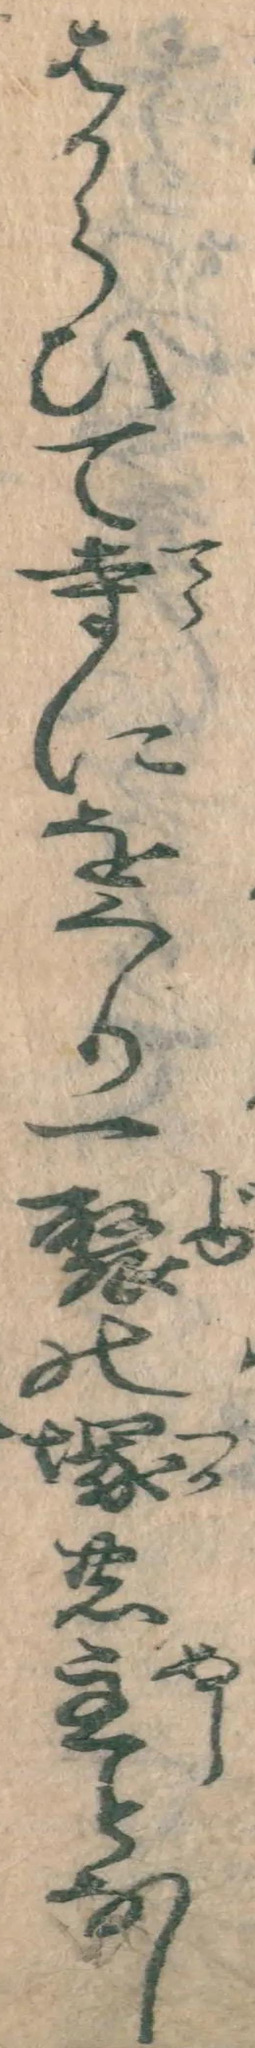はからひて寺にをくり一聚の塚の主となし

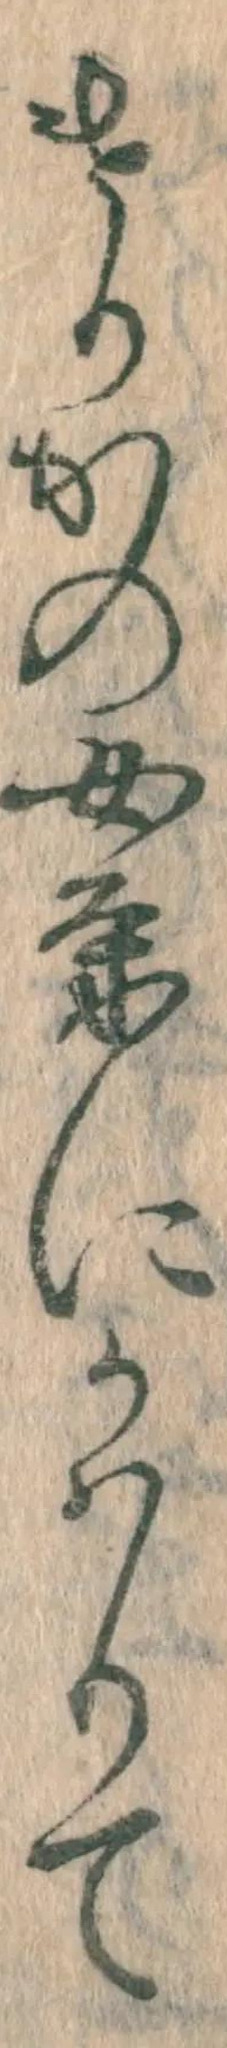けりかの女房にかはりて
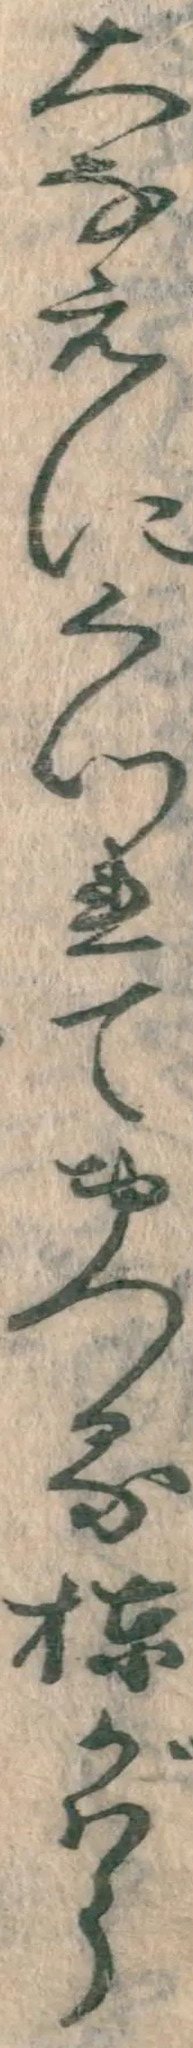大なえにくづれておつる棟がはら
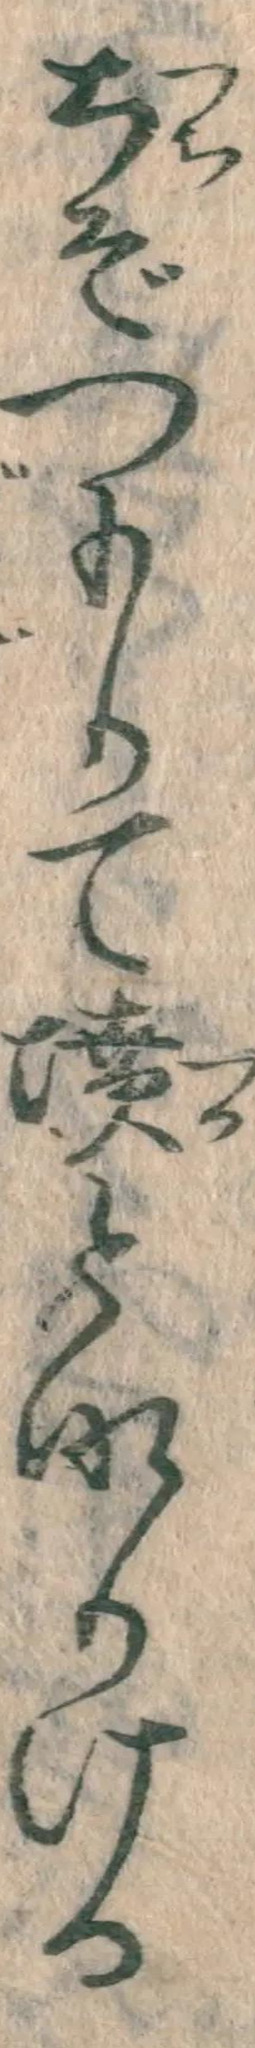土ぞつもりて墳となりける
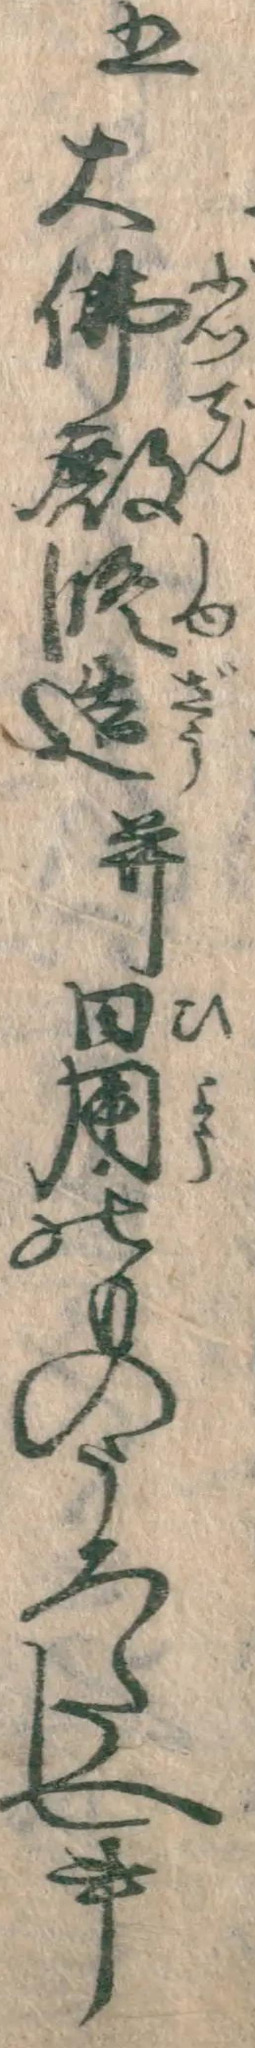五大佛殿修造并日用のものうろたへし事
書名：艱難目異志. 上,下
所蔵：国立国会図書館 National Diet Library, JAPAN
